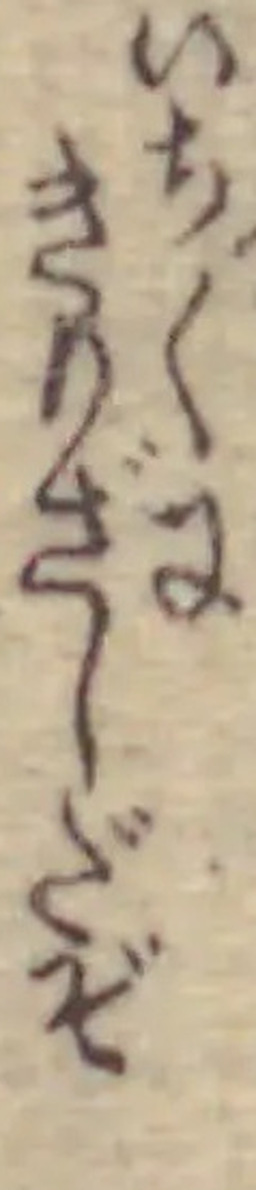きもざしだぞ
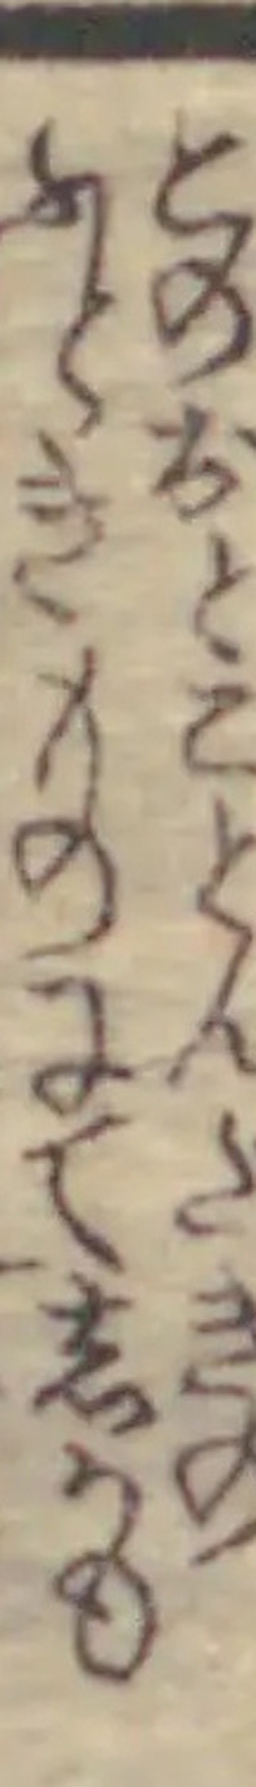ふときものにてしかも
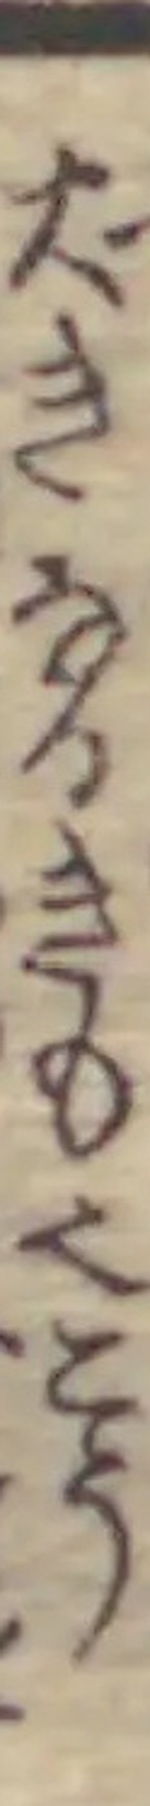大きなるきも也こう
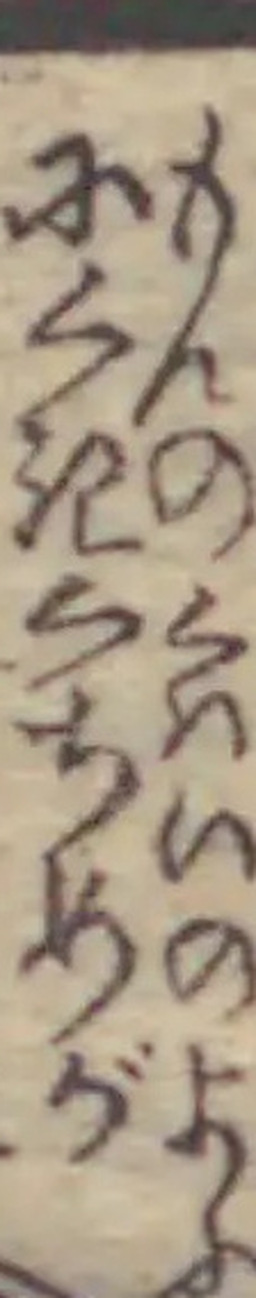にくきくちめが
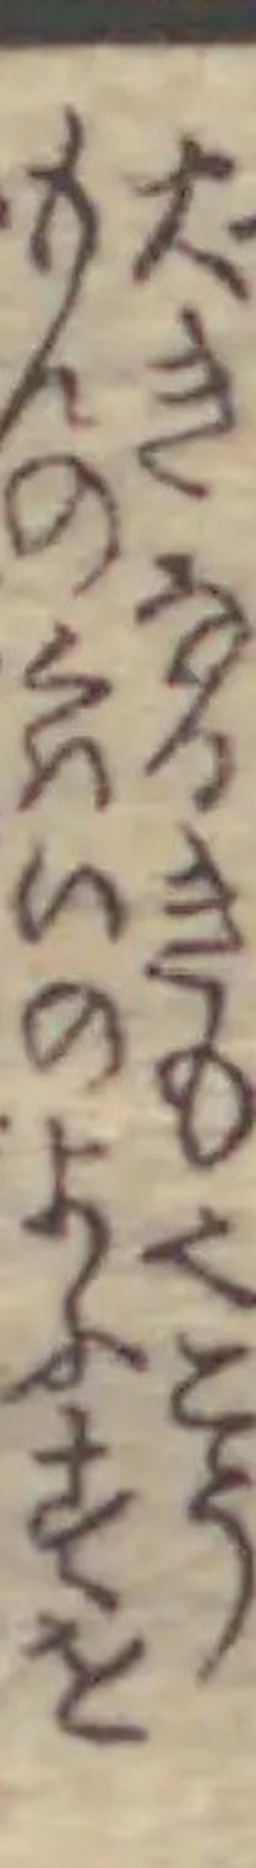もんのくはいのよふすを
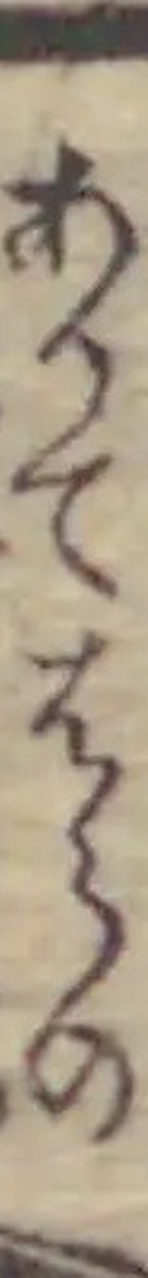ありてはらの
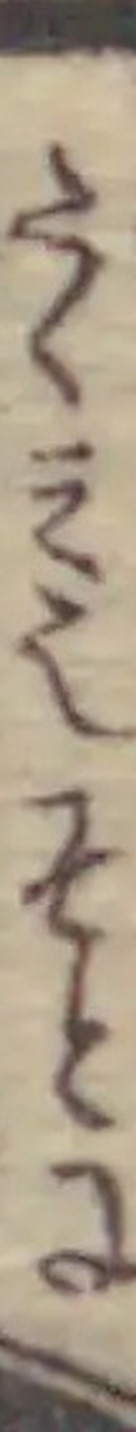たくみ也そとに
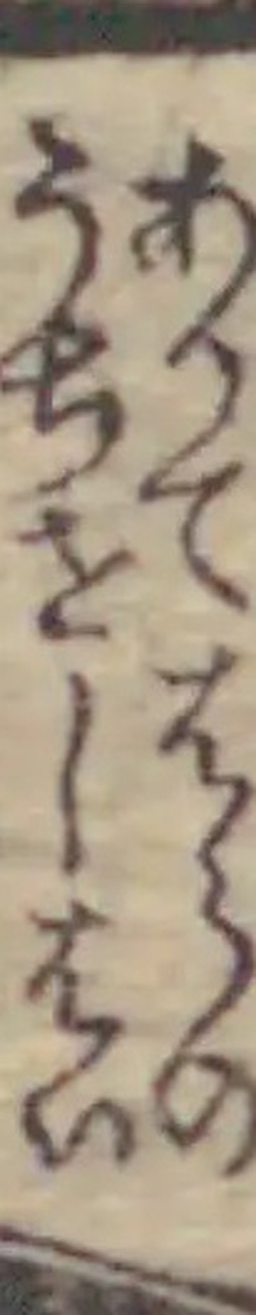うちをしはい
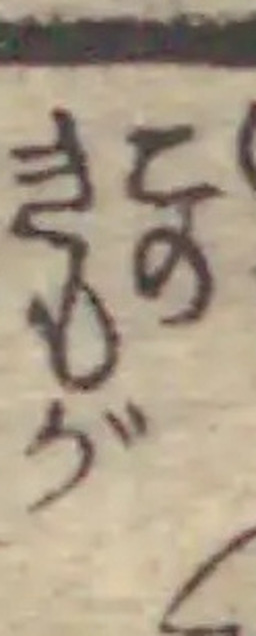きもが
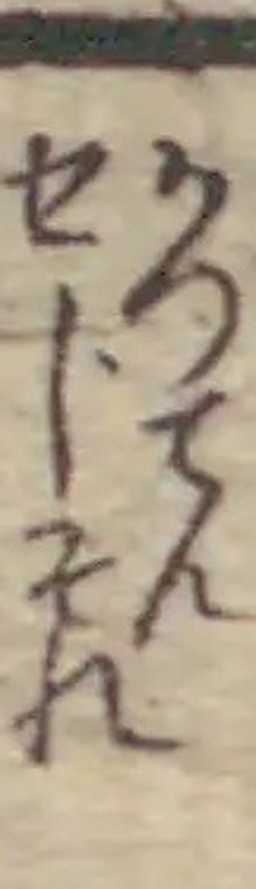せじそれ
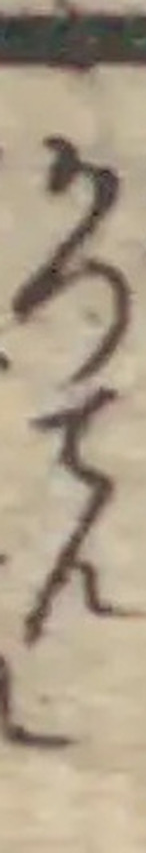かつてん
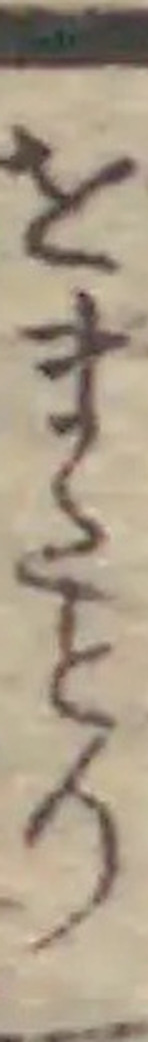をまたとり
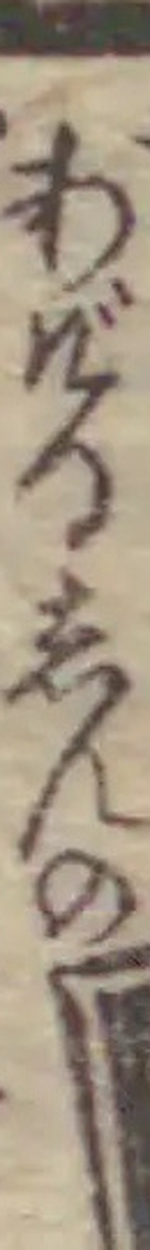あげるしんの
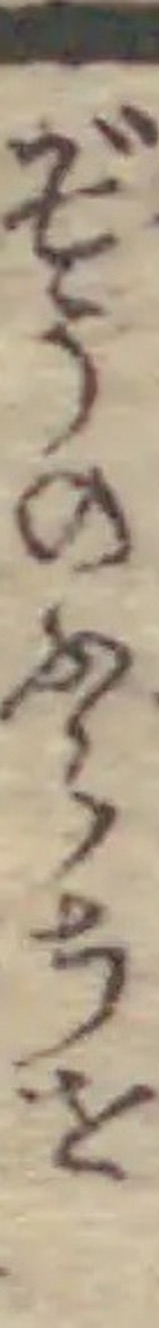ぞうのふらちを
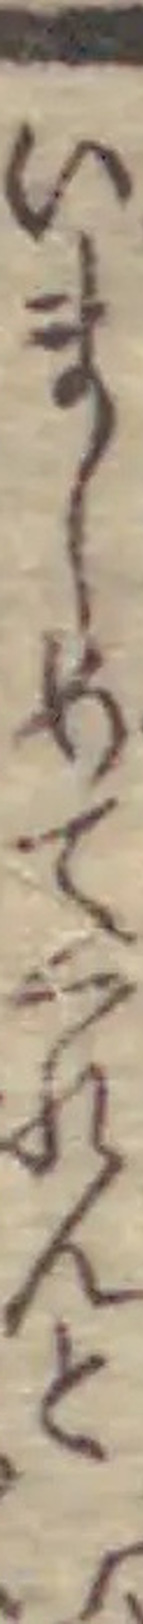いましめてくれんと
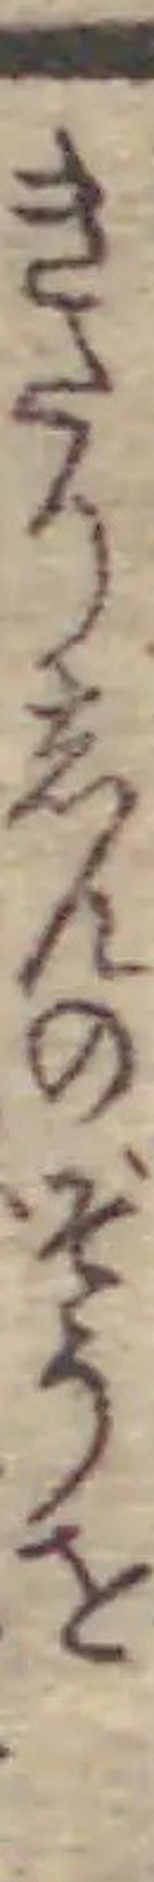きたりしんのぞうを
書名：腹内養生主論 3巻
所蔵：国立国会図書館 National Diet Library, JAPAN
